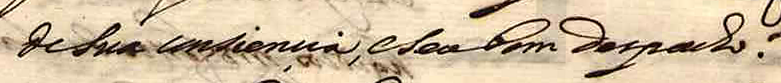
de Sua consiencia, e seu bom despacho.
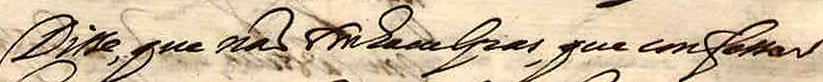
Disse, que naõ tinha culpas, que confessar
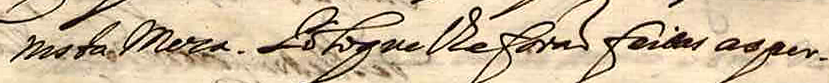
nesta Meza. Polo que lhe foraõ feitas as per
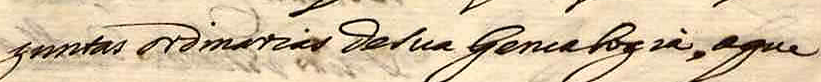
guntas ordinarias de sua Genealogia, a que
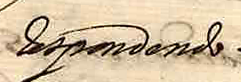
Respondendo
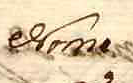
Nome
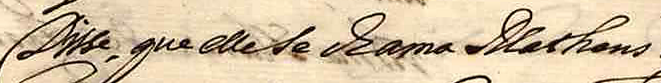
Disse, que elle se chama Matheus
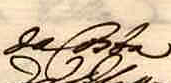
da Costa
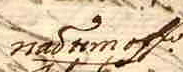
naõ tem off.o
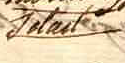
Idad
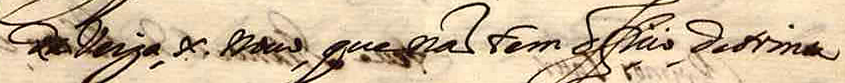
da Veiga, x. nouo, que naõ tem officio, de trinta
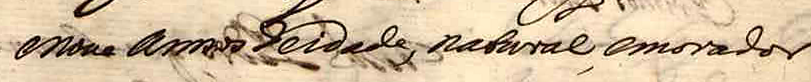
e noue annos de idade, natural, e morador
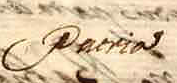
Patria
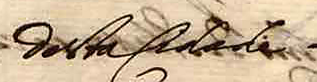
desta Cidade
